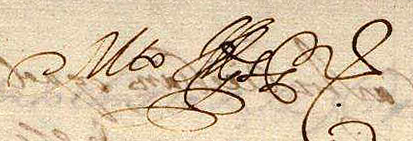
M.to Ills sres
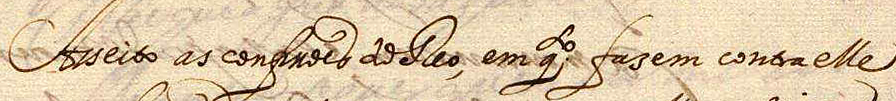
Asseito as confissoẽs do Reo, em qto fazem contra elle
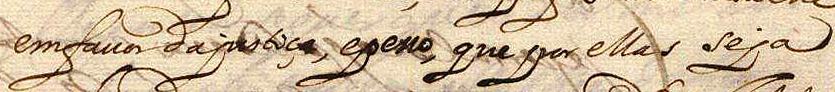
em fauor da justiça, e pesso, que por ellas seja
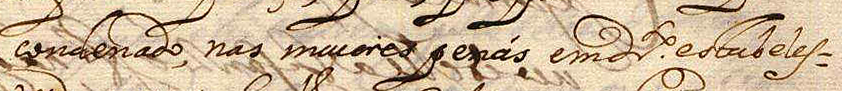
condenado, nas maiores penas em dr.to estabeles
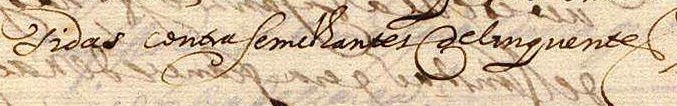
sidas contra Semelhantes delinquentes
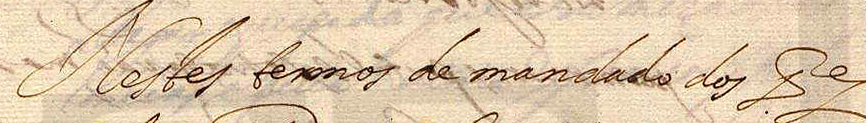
Nestes termos de mandado dos s.res
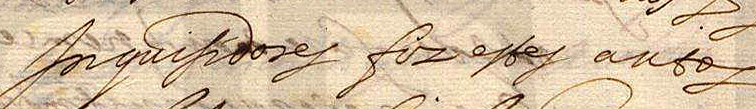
Jnquisidores fiz estes autos
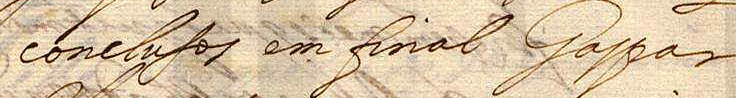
conclusos em final Gaspar
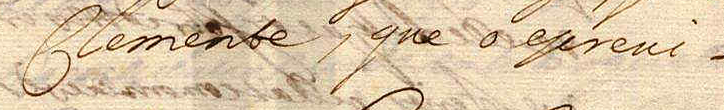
Clemente, que o escreui
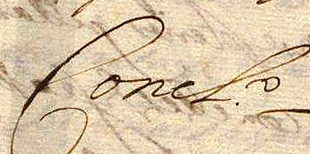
Concl.o
